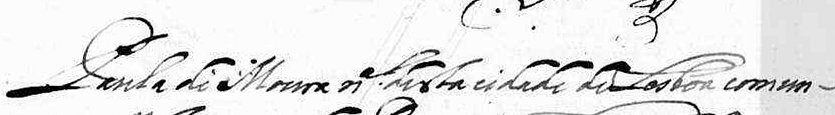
Paula de Moura n.al desta cidade de Lisboa comun
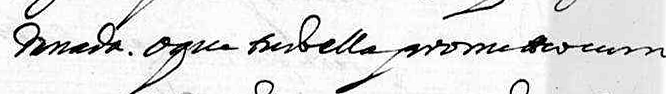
denada. o que tudo ella prometteo cum
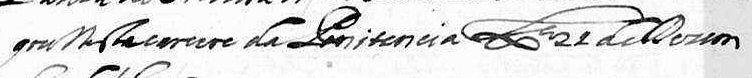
gou nesta carcere da Penitencia Lxa 21 de Dezem
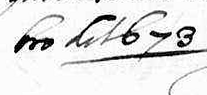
bro de 1673
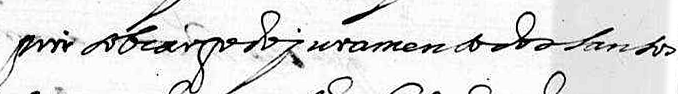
prir sob cargo do juramento dos santos
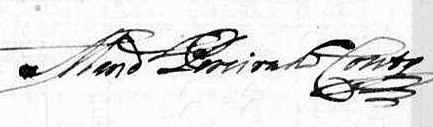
ManoeL Pereira do Couto
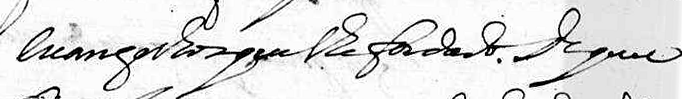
euangelhos que lhe foi dado. De que
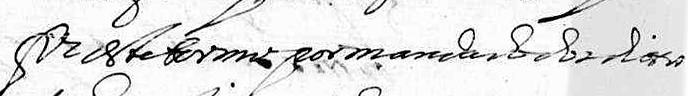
fiz este termo por mandado dos dictos
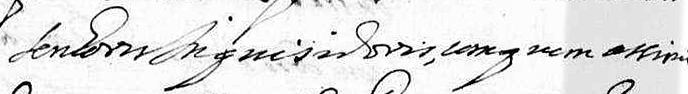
senhores Inquisidores, com quem assinei
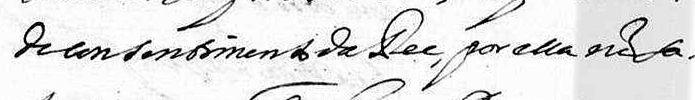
de consentimento da Ree, por ella naõ sa
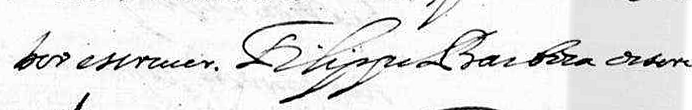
ber escreuer. Filippe Barboza o scre
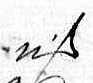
ui.
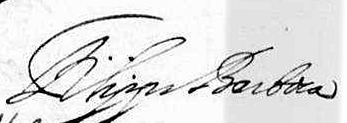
Filippe Barboza
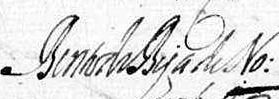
Bento de Beja de No
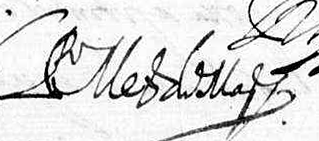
Po Mexa de Mages
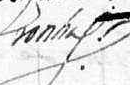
ronha
